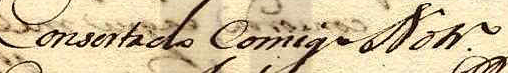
Consertado Comigo Notr.o
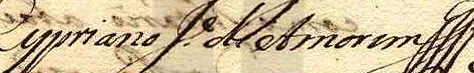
Cypriano Je de Amorim
